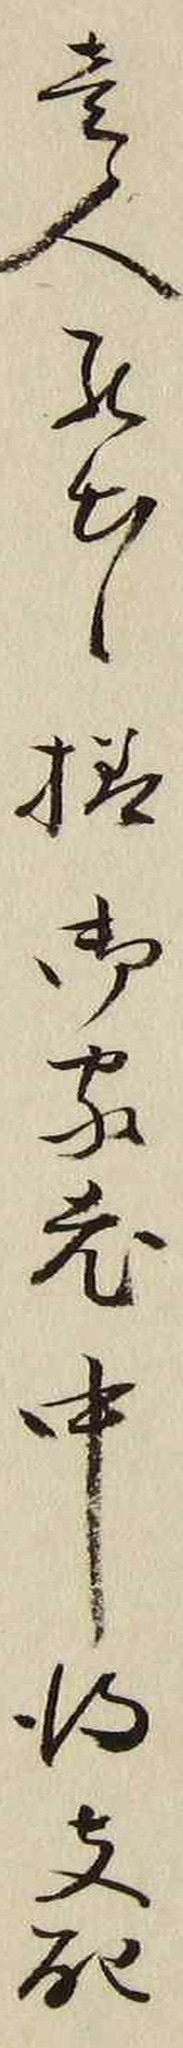壱人罷出候様御家老中得支配
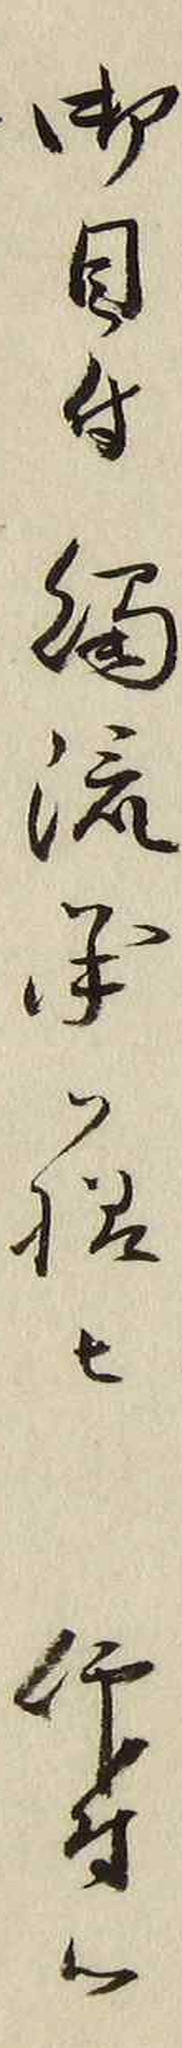御目付触流承候様被仰付候
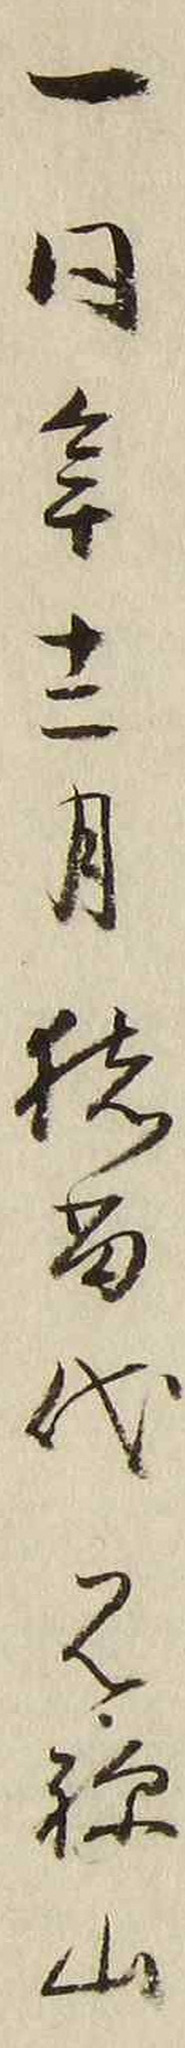一同年十二月猪苗代見祢山

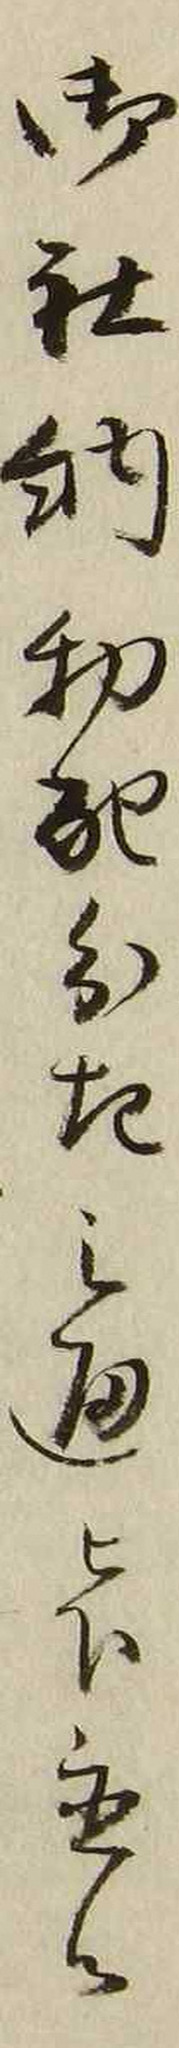御社納物配分左之通被下置候
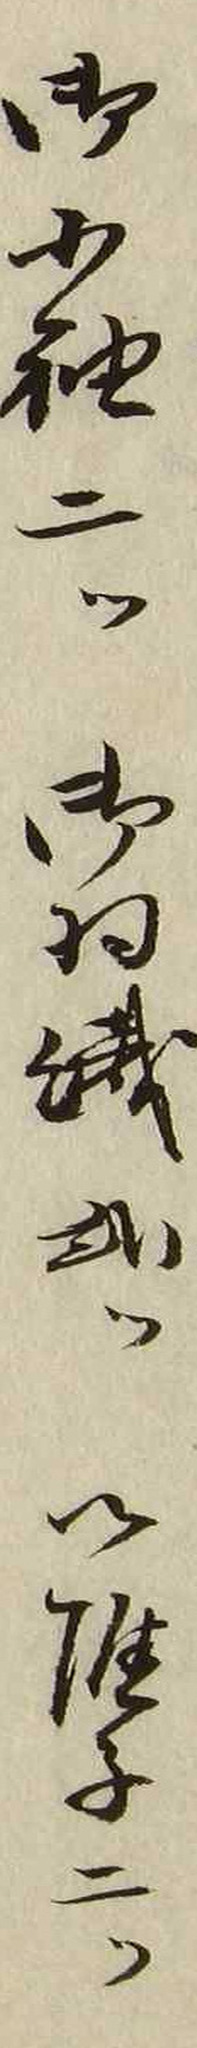御小袖二ツ御羽織弐ツ御帷子二ツ
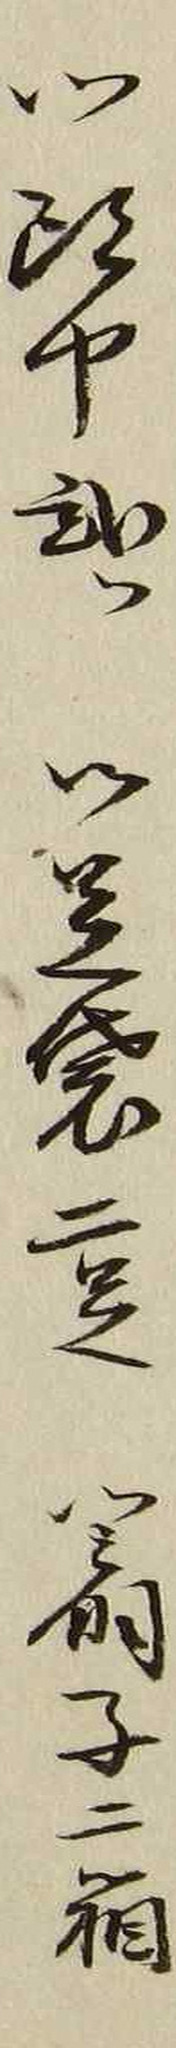御頭巾弐ツ御足袋二足御扇子二箱
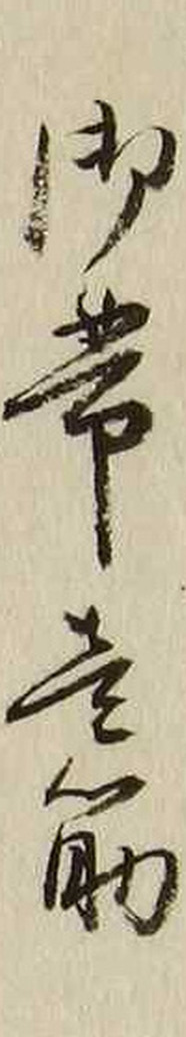御帯壱筋
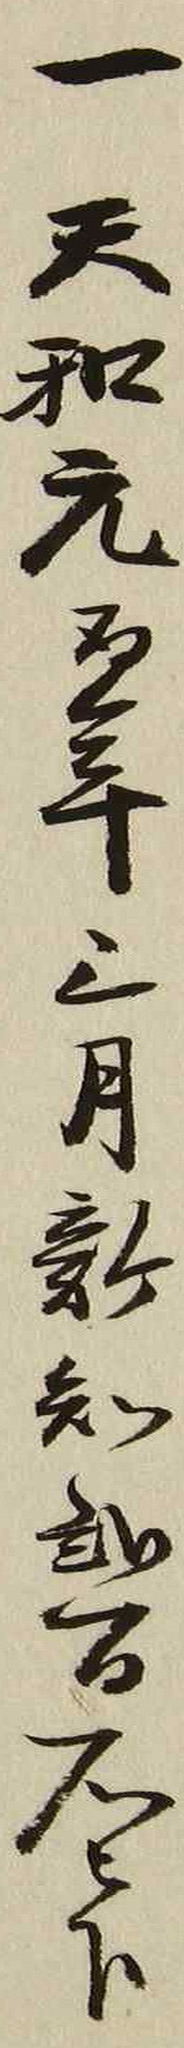一天和元酉年三月新知弐百石被下
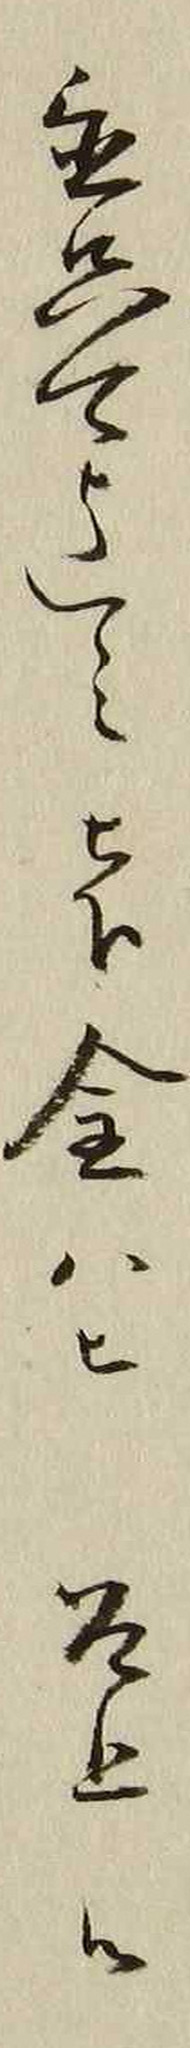置只今迄之被下金ハ被召上候
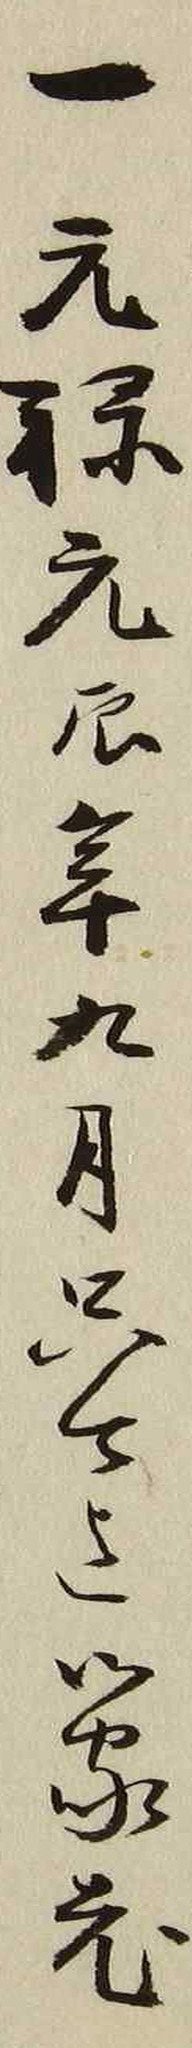一元禄元辰年九月只今迄御家老
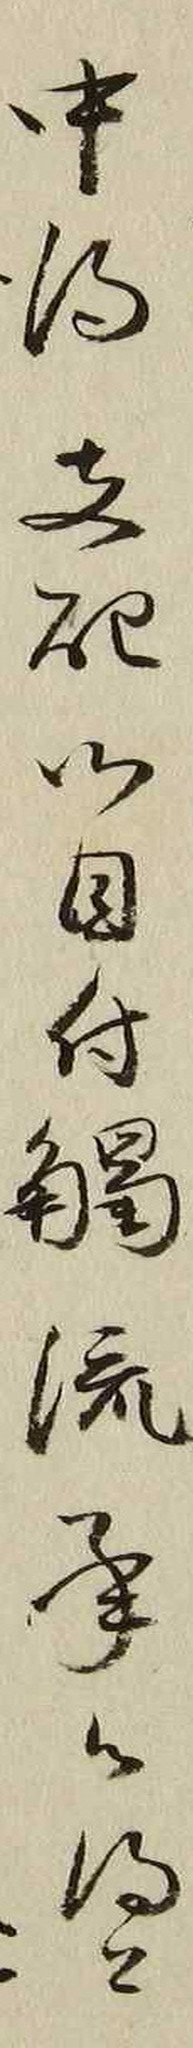中得支配御目付触流承候得と
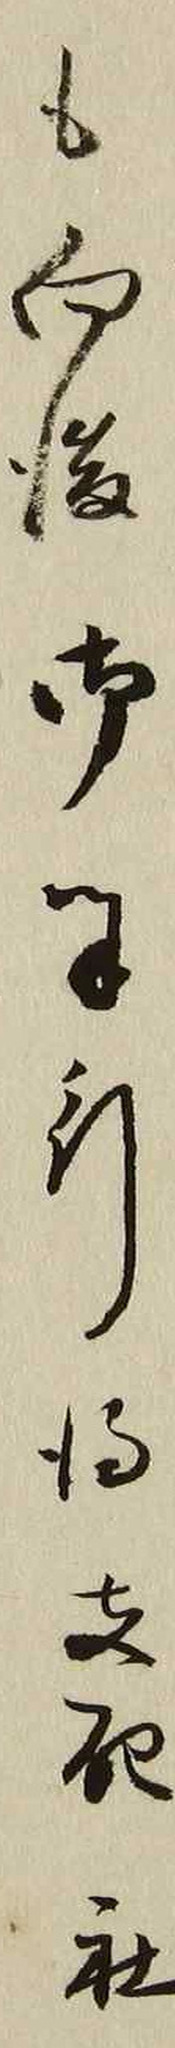も向後御奉行得支配社
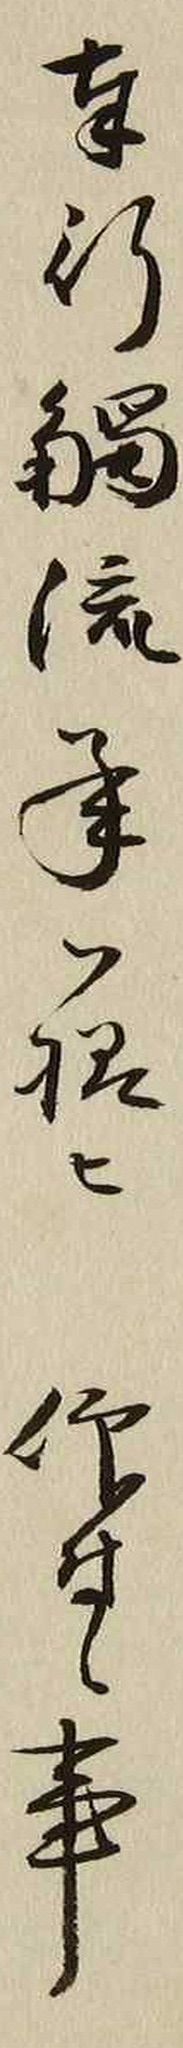奉行触流承候様被仰付候事
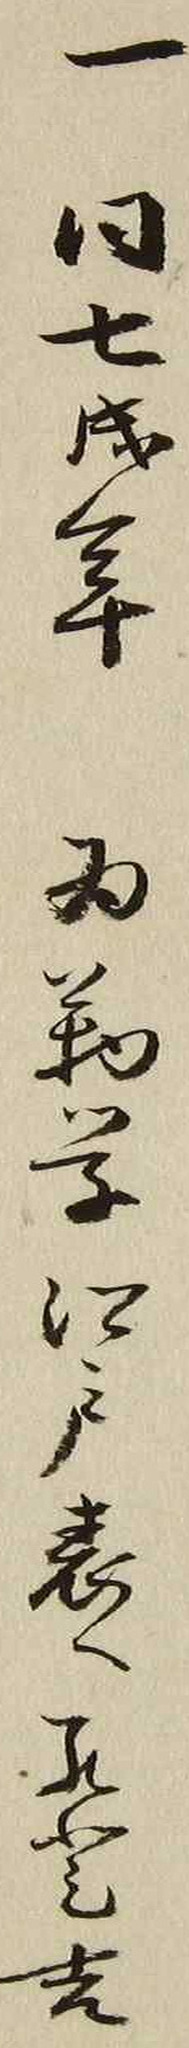一同七戌年為勤学江戸表へ罷登吉
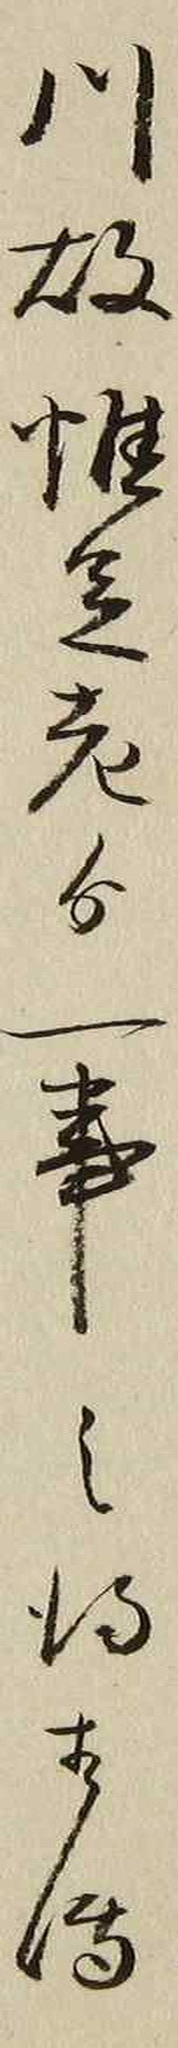川故惟足老ゟ一事之得相伝
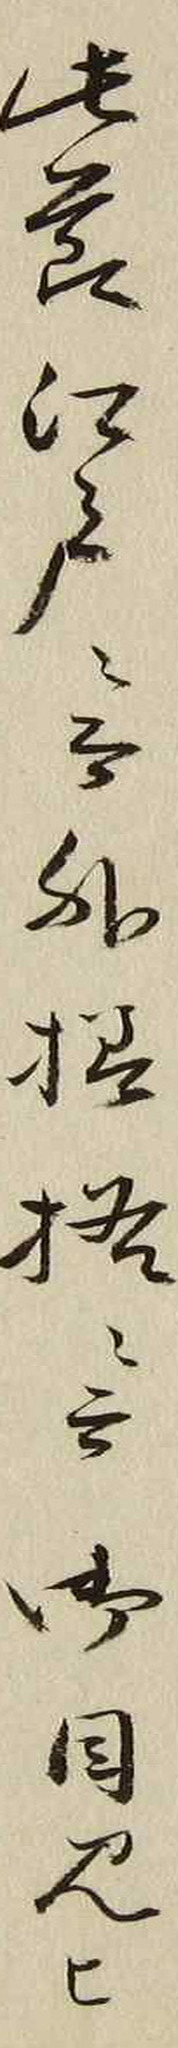此節江戸ニ而外様格ニ而御目見被
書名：諸士系譜　巻之291　さ之部23
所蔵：会津若松市立会津図書館
